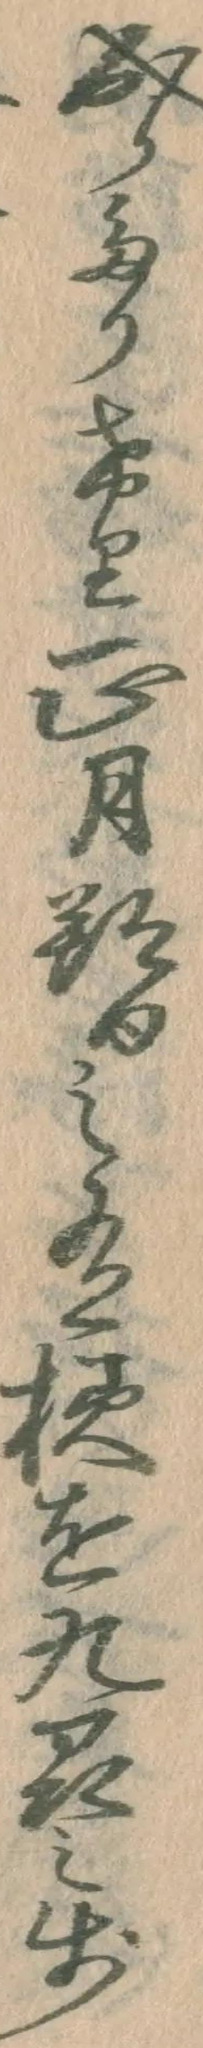成り多り希里正月朔日之有様を九州之歩
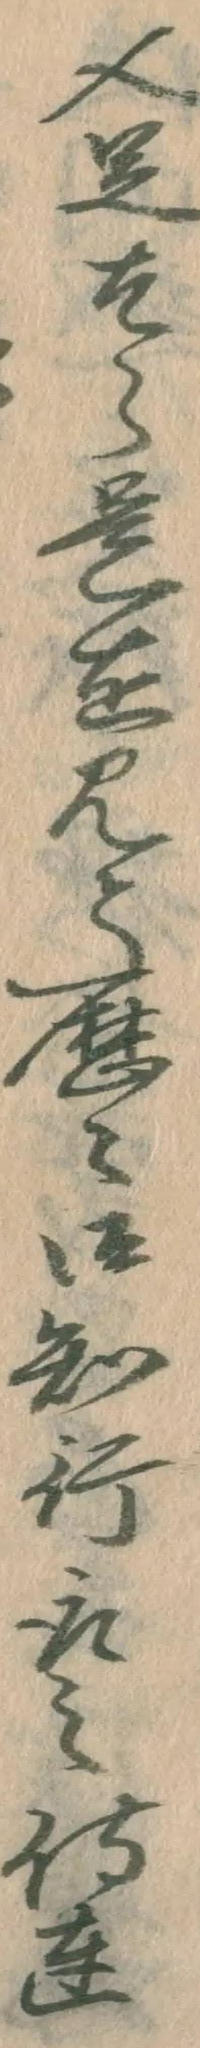人足たら是を見て歴々御知行取之侍達
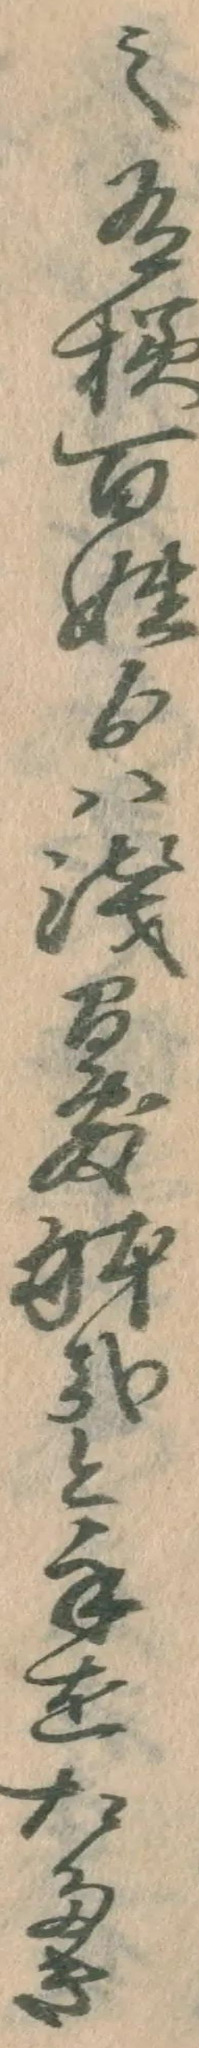之有様百姓ゟは浅間敷躰哉と手をた多き
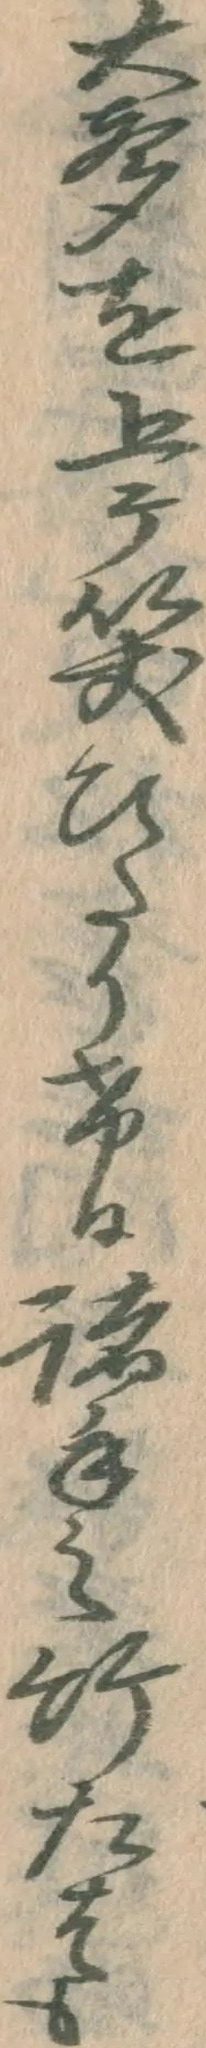大声を上て笑ひたり希る諸手之竹た者も
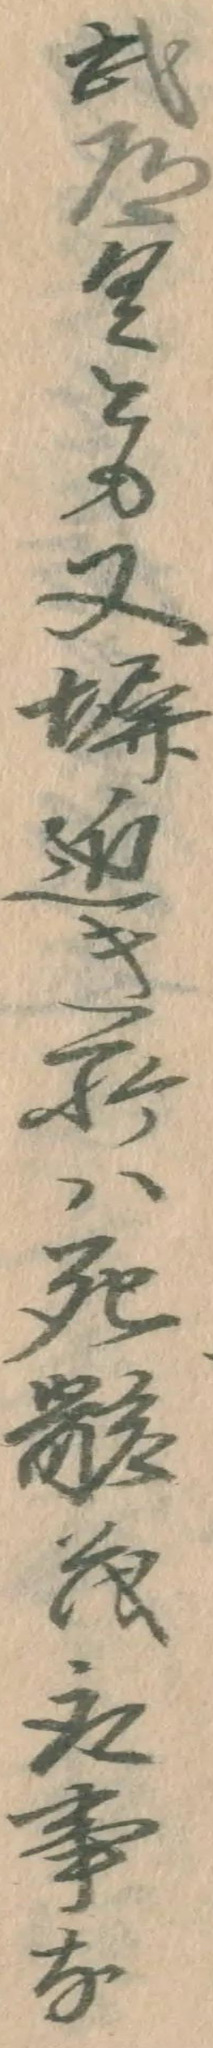武道具とも又塀近き所は死骸茂取事な
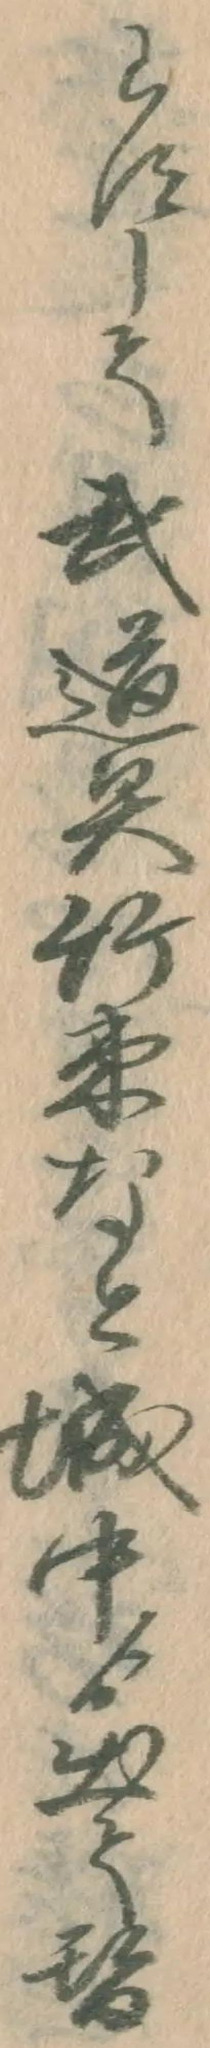已須して武道具竹束なと城中ゟ出て替

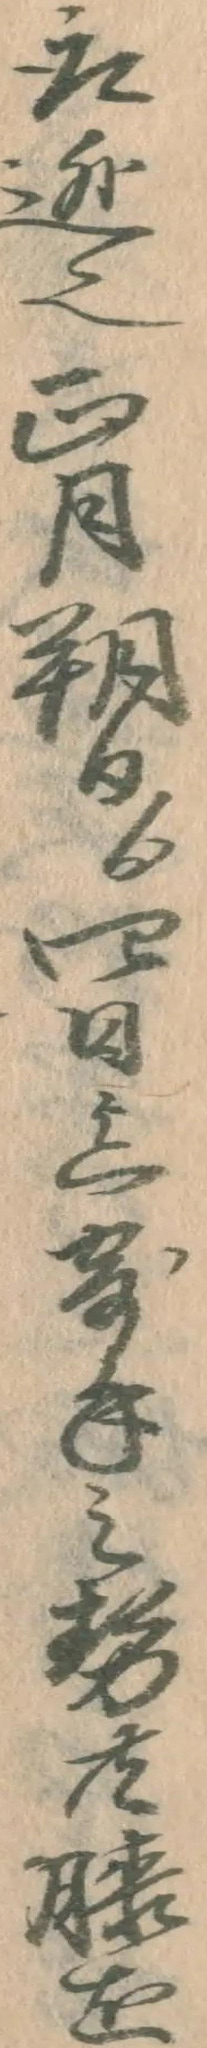取逃也正月朔日ゟ四月迄寄手之勢共膝を
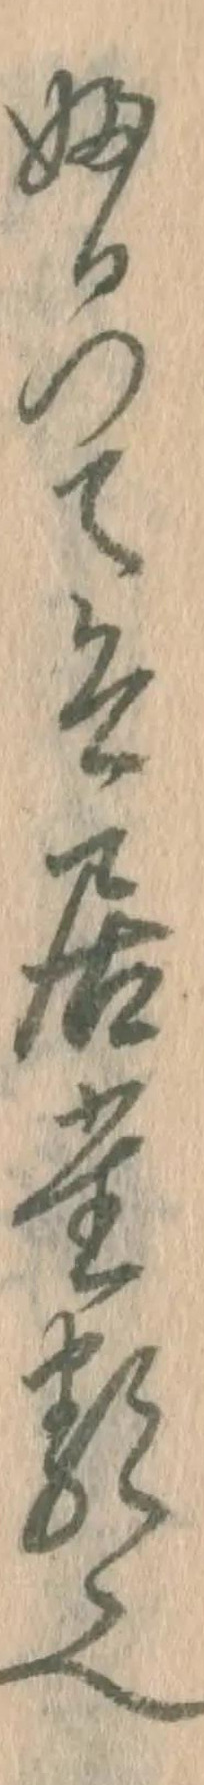婦るつてそ居堂類也
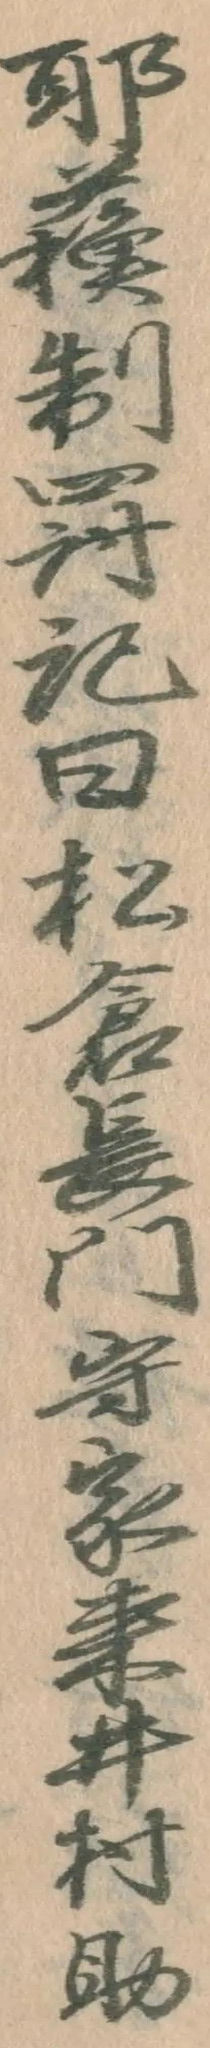耶蘇制罸記曰松倉長門守家来井村助
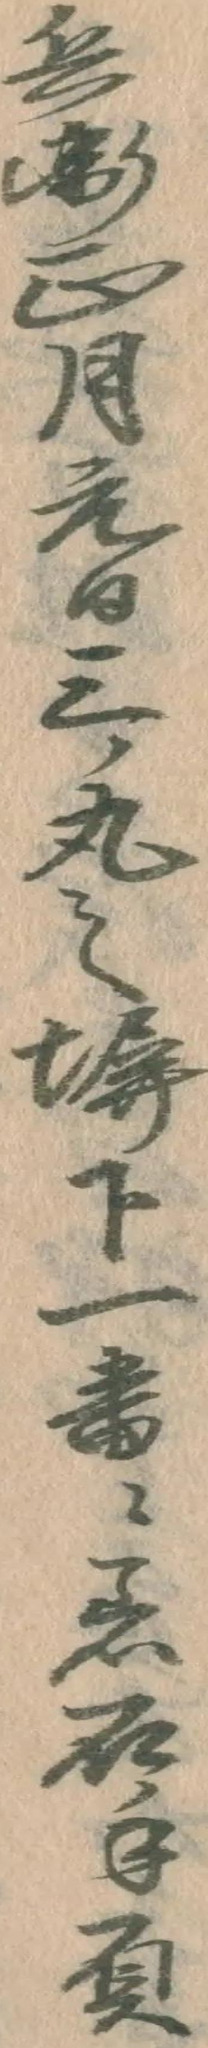兵衛正月元日三之丸之塀下一番に着石手負
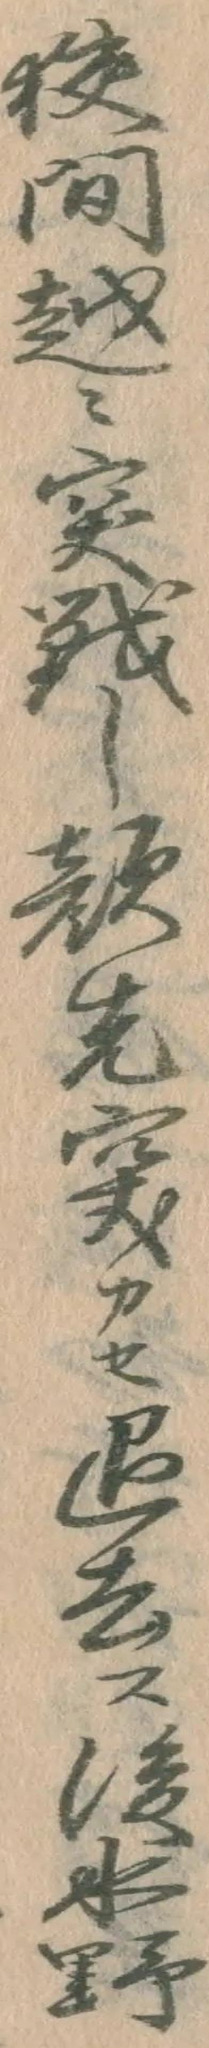狭間越に突戦し親先突かせ退去す後水野
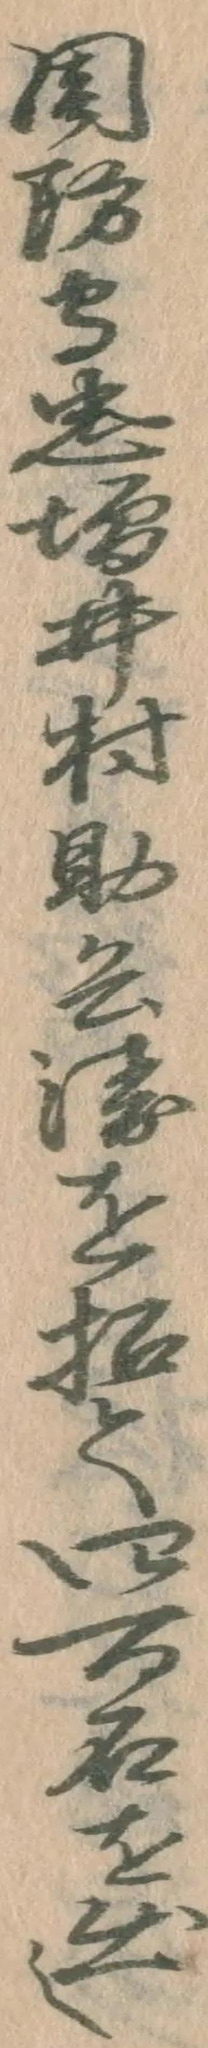周防守忠増井村助兵衛を招て四万名を出し
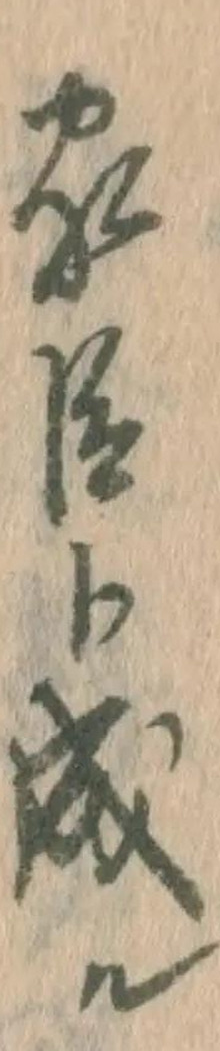家臣と成る
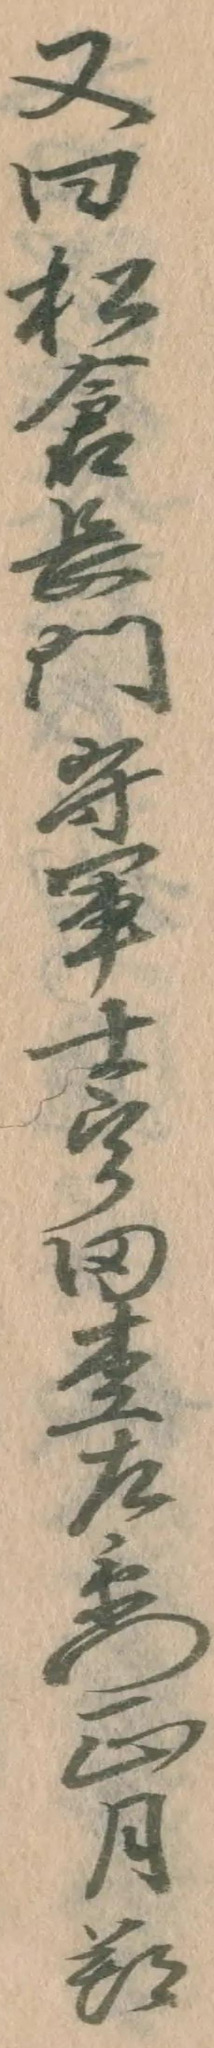又曰松倉長門守軍士宇田杢左衛門正月朔
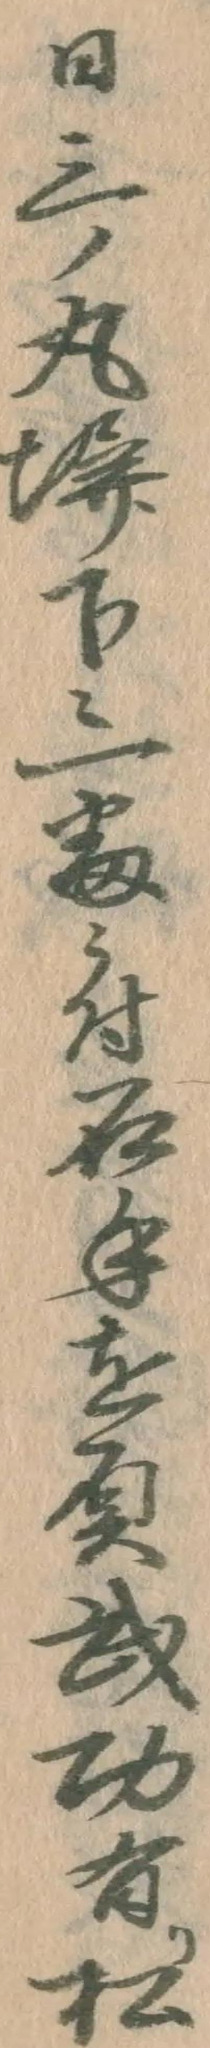日三之丸塀下に一番に付石手を負武功有り松
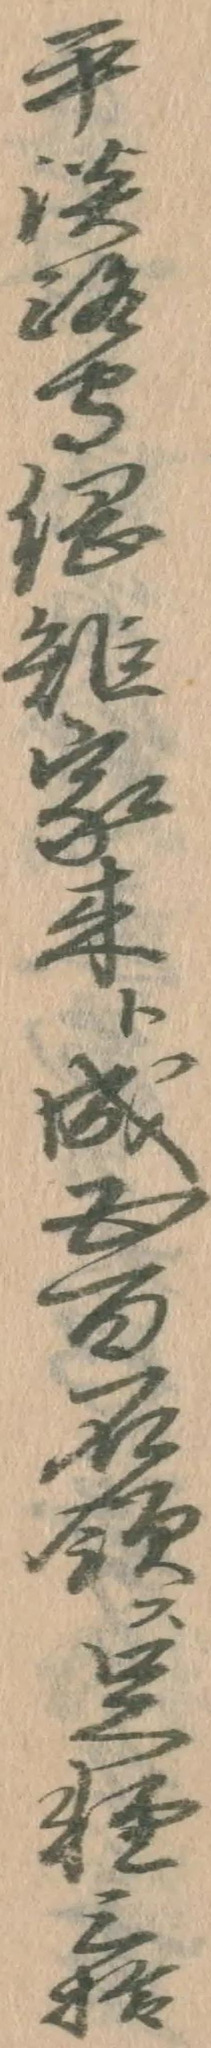平淡路守綱矩家来と成五百石領す足軽三拾
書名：切支丹御退治記 49巻. [5]
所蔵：国立国会図書館 National Diet Library, JAPAN
